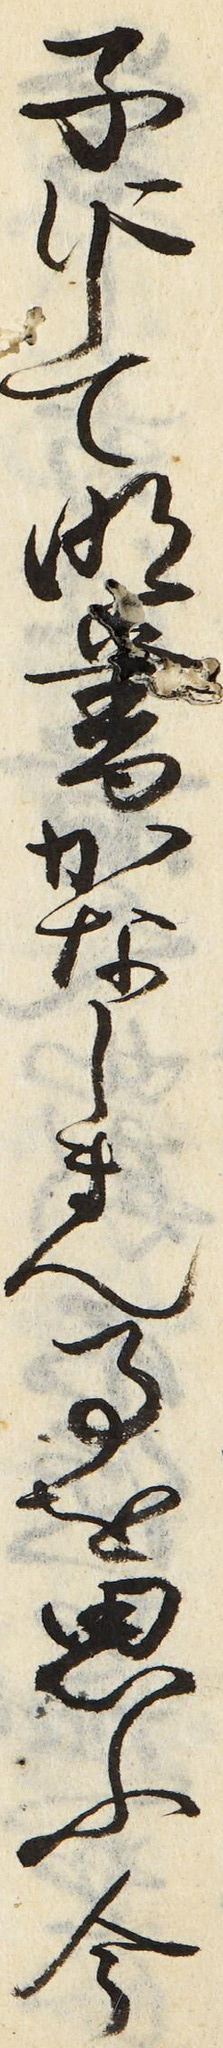子にして明暮かなしまん事を思ふ今
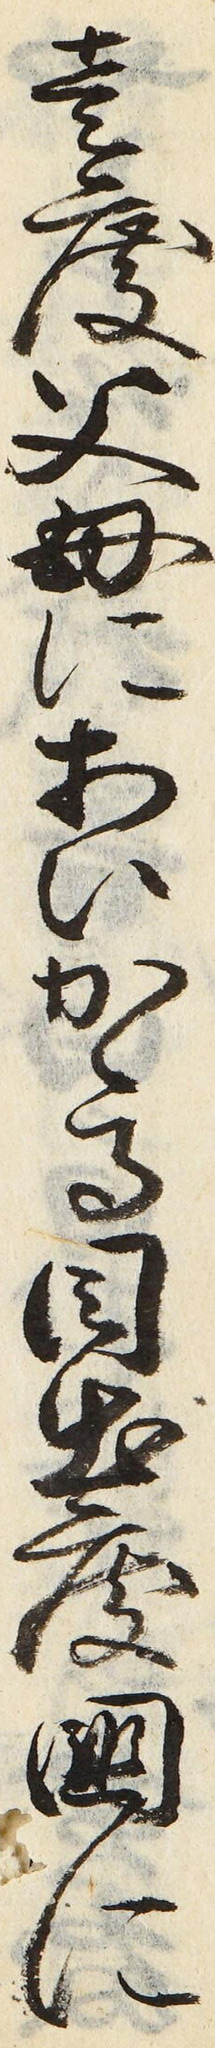壱度父母にあひかゝる目出度国に
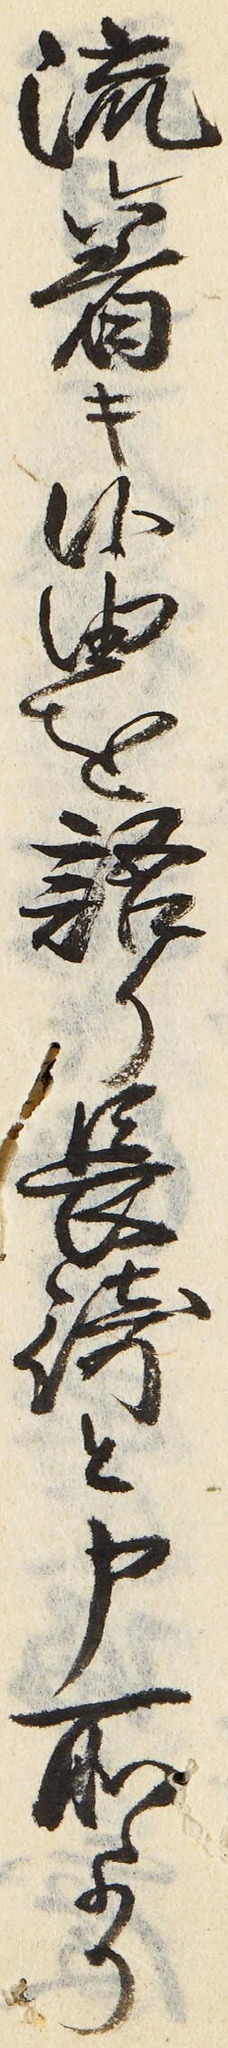流れ着き候由を語り長崎と申所より
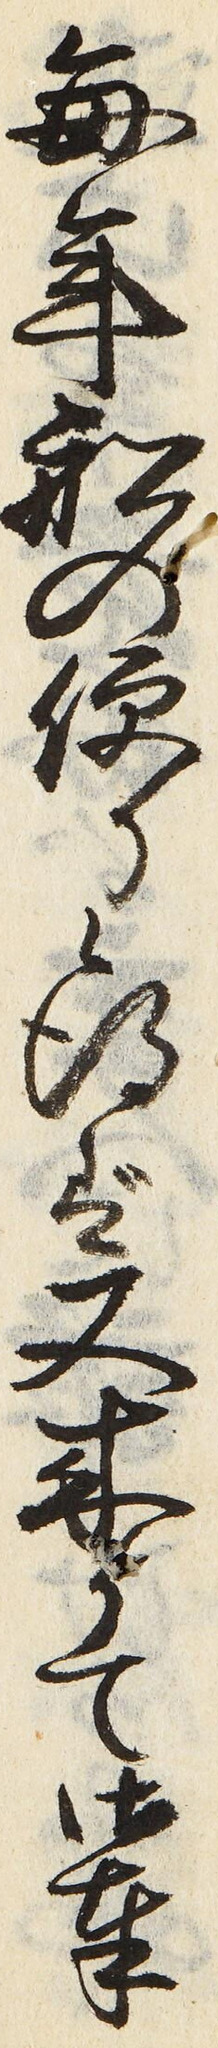毎年船の便り候得ば又来りて御奉
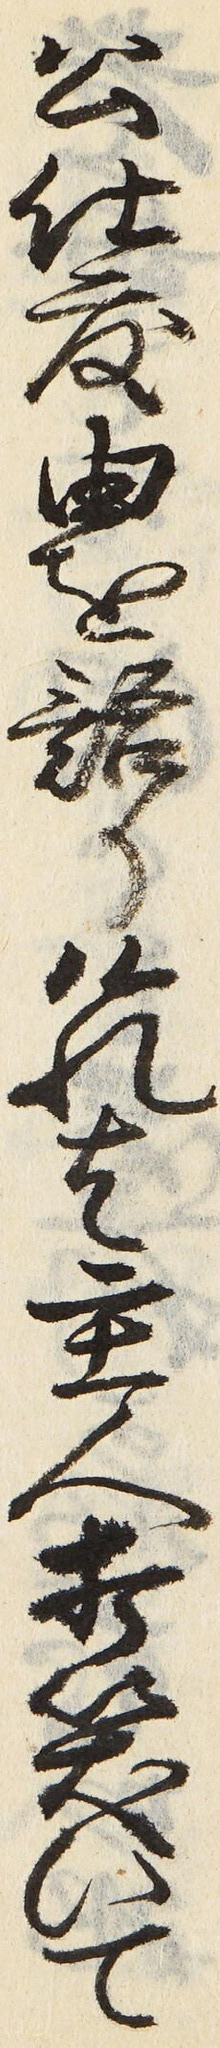公仕度由を語りけれは主人打笑ひて
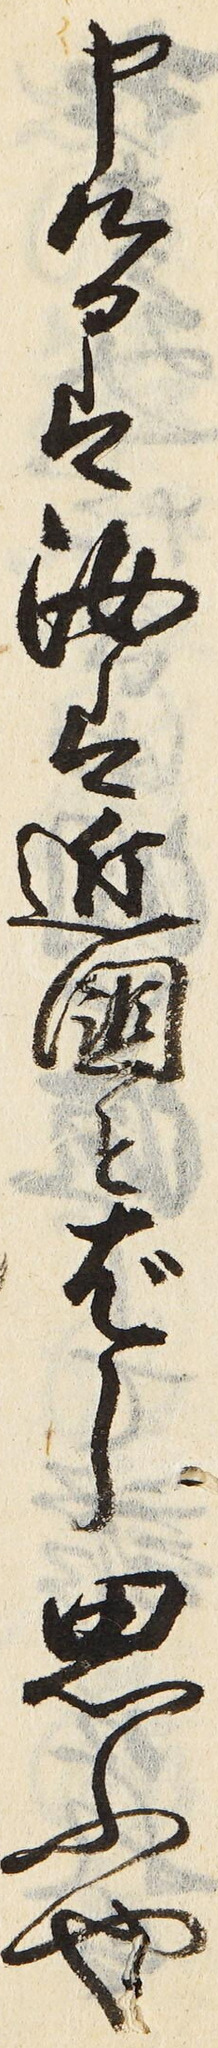申けるは汝は近国とばし思ふや
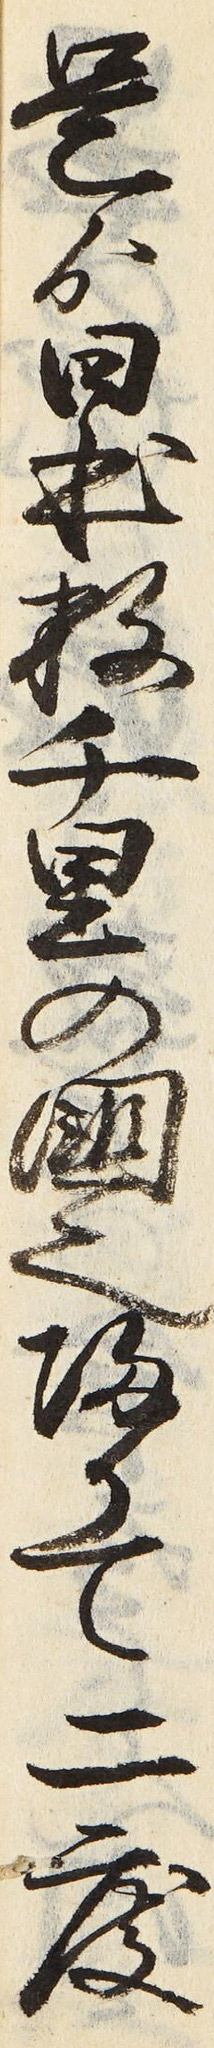是ゟ日本数千里の国也帰りて二度
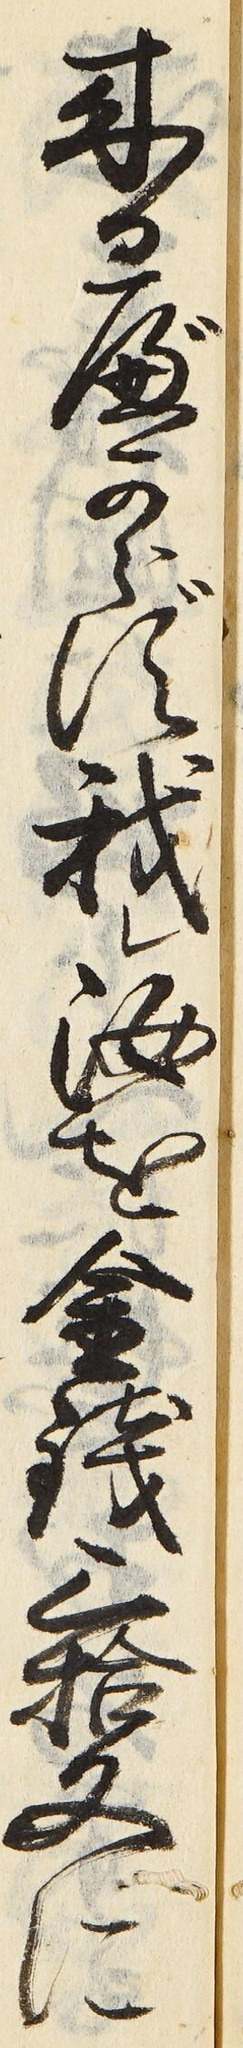来るべからず我れ汝を金銭三拾文に
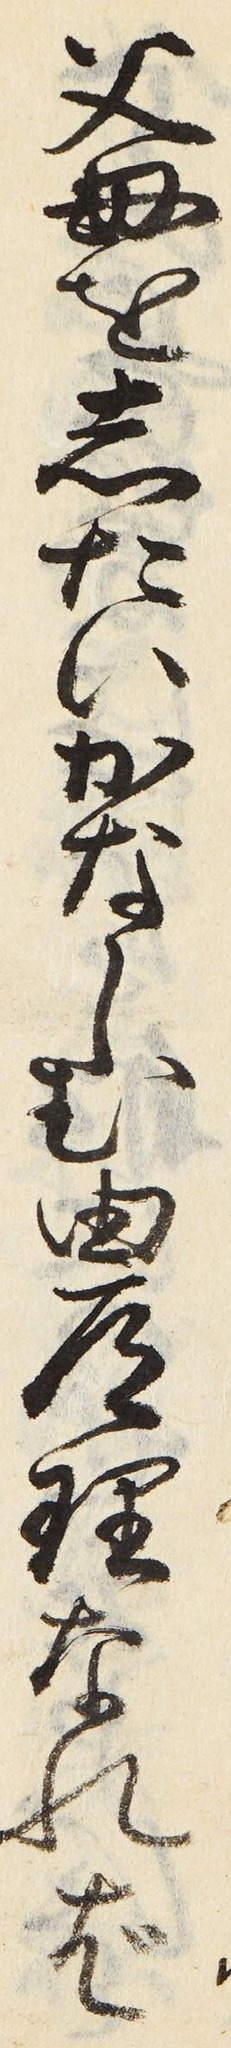父母をしたいかなしむ由道理なれば
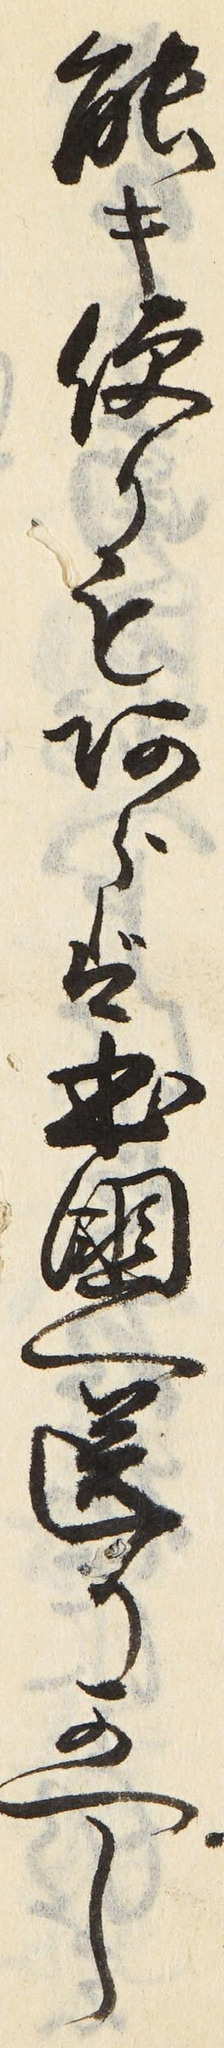能き便りもあらば本国へ送りかへし
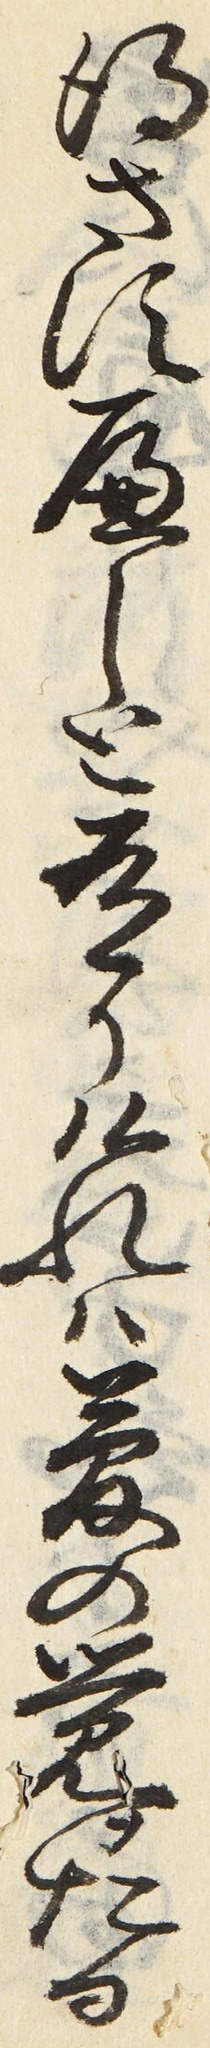得さすへしと有りけれは夢の覚めたる
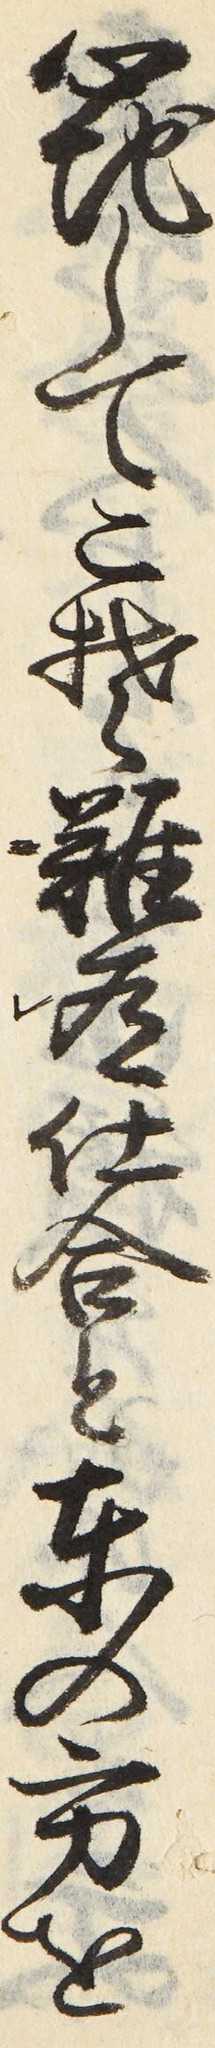心地してこそ難有仕合と東の方を
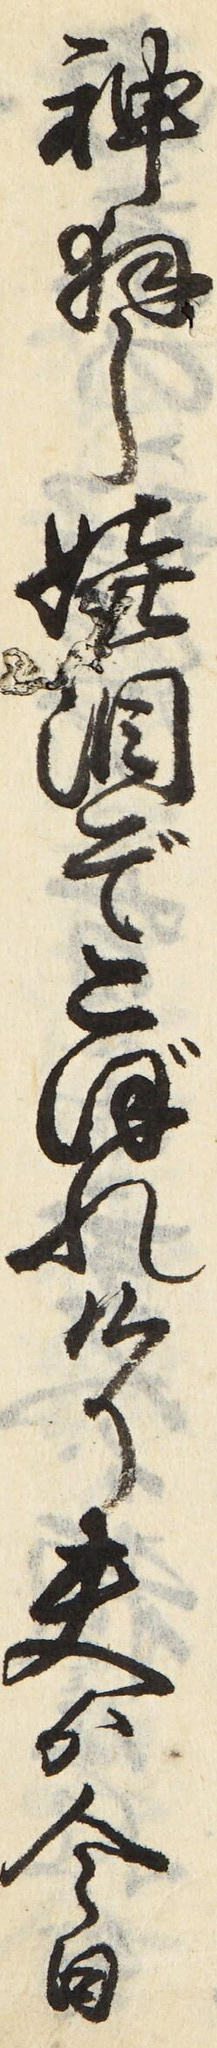神拝し嬉泪ぞこぼれけり夫ゟ今日
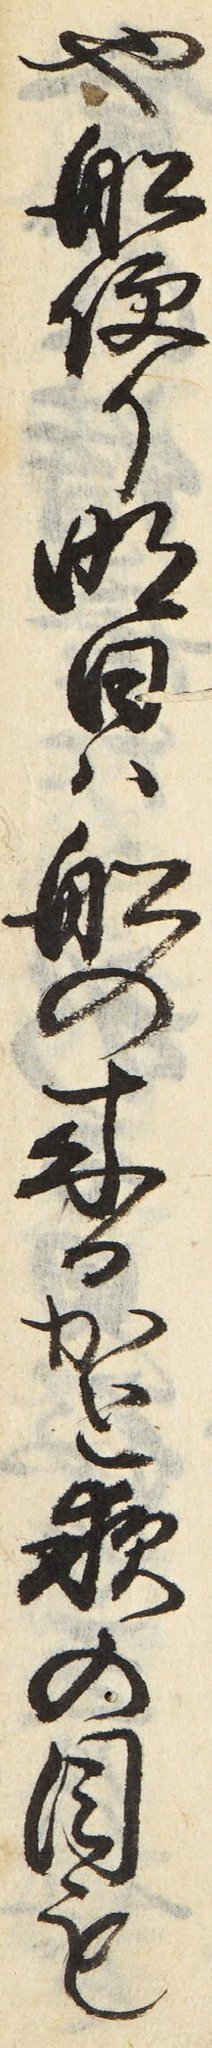や船便り明日は船の来るかと夜の目も

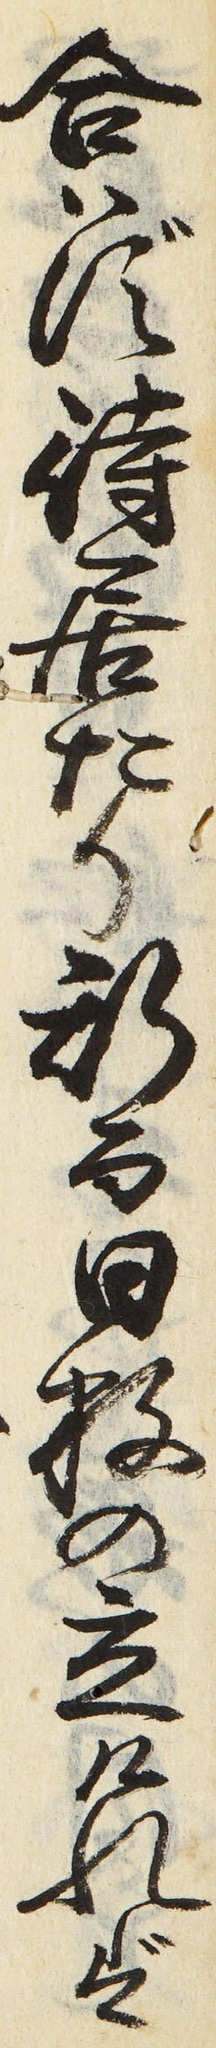合はず待居たり斯而日数の立けれは
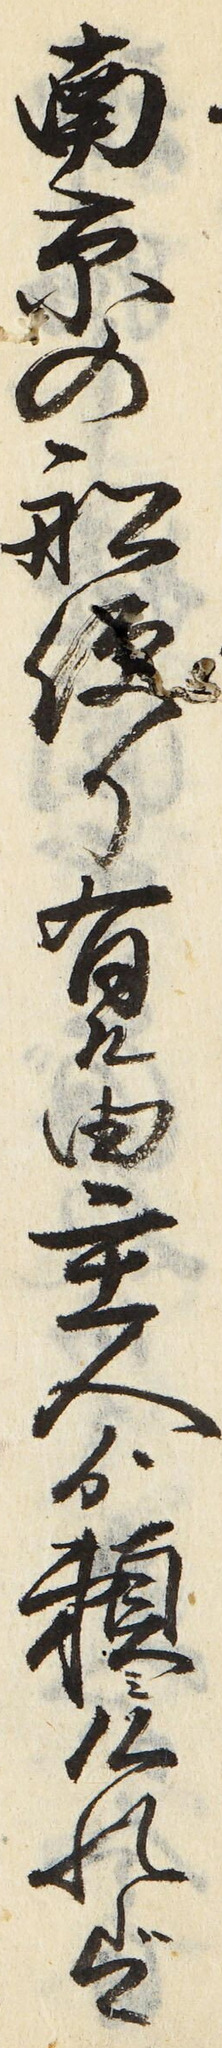南京の船便り有る由主人ゟ頼みければ
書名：華夷九年録
